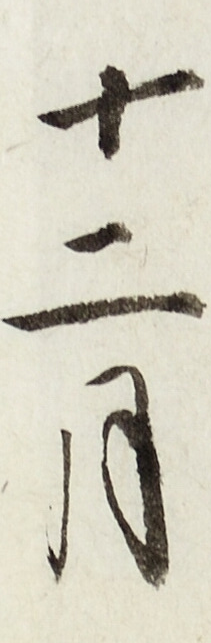十二月
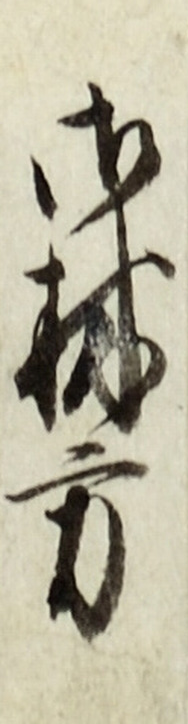御林方

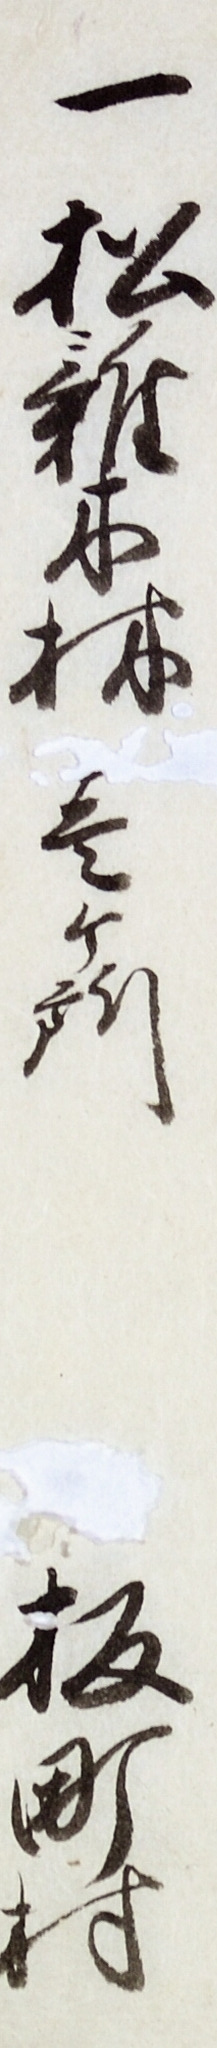一松雑木林壱ヶ所板町村
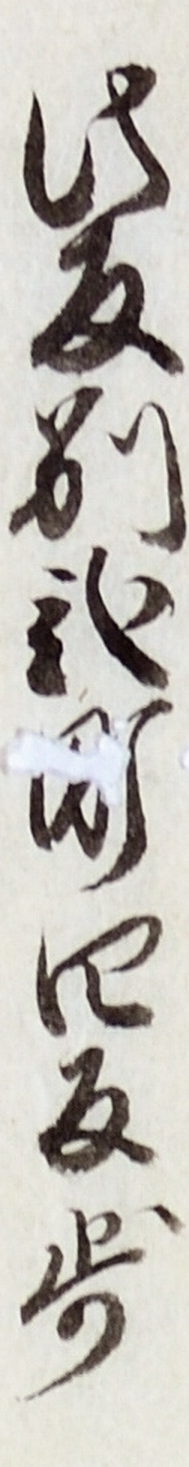此反別弐町四反歩
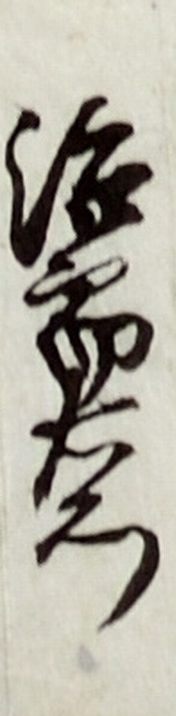治郎右衛門
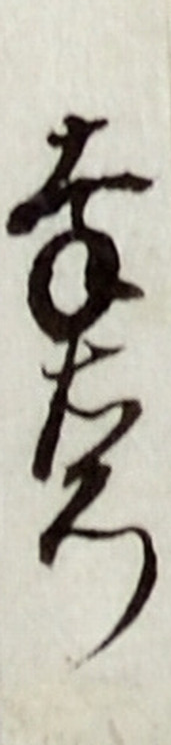市右衛門
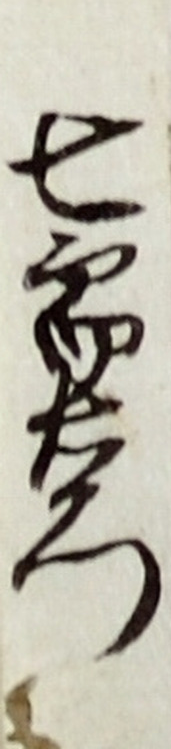七郎右衛門
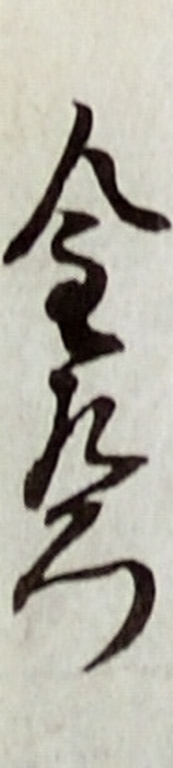金左衛門
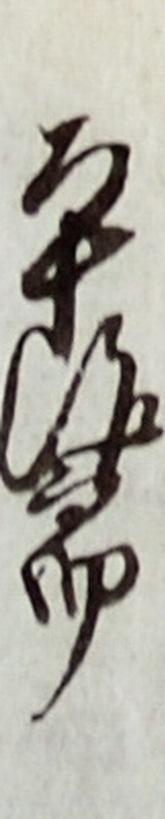平治郎
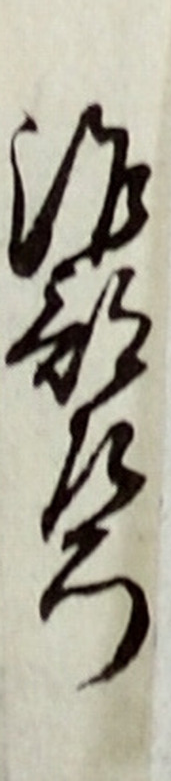治部左衛門
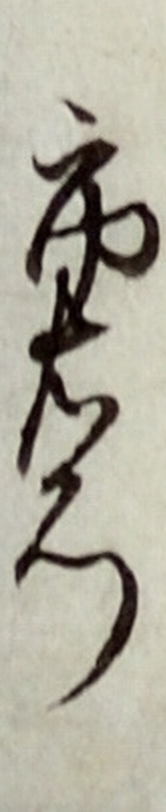市右衛門

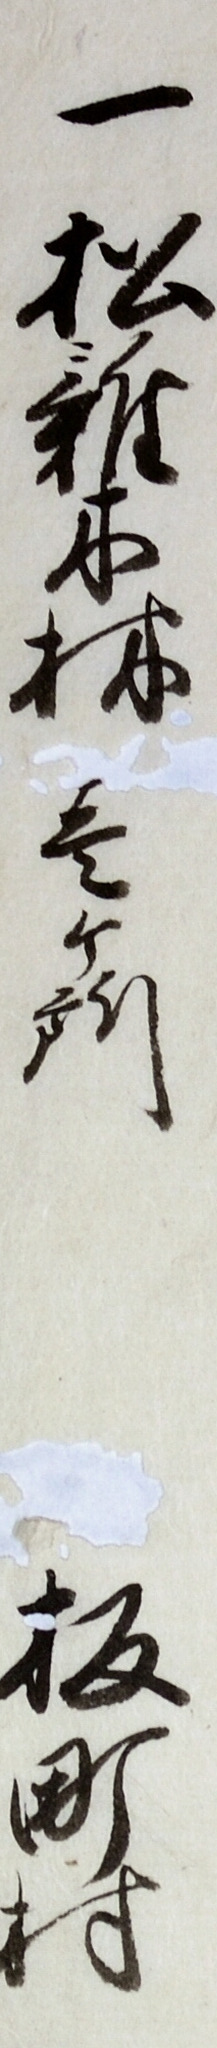一松雑木林壱ヶ所板町村
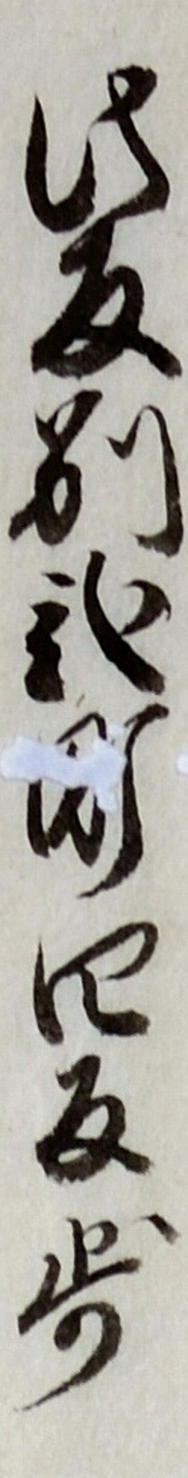此反別弐町四反歩
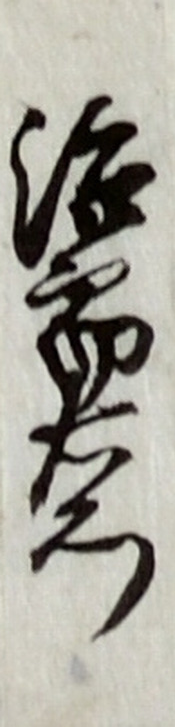治郎右衛門
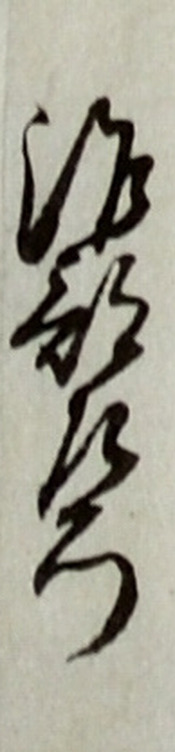治部左衛門

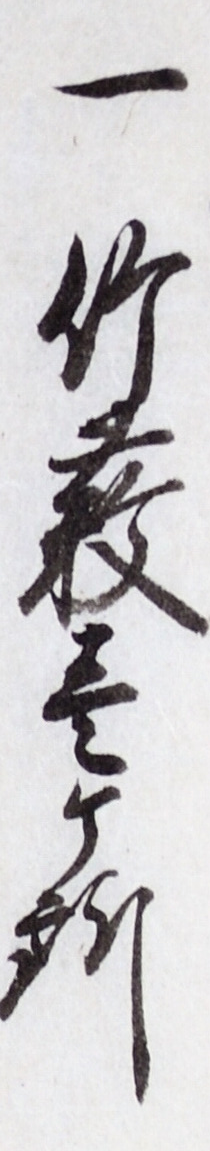一松林壱ヶ所
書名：御領分中御林御藪附帳
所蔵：伊那市立高遠町図書館・合同会社AMANE
